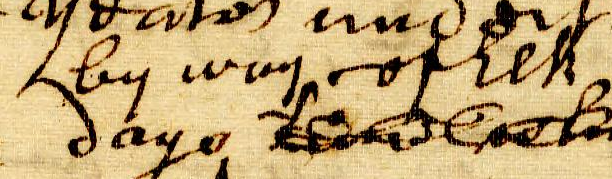by way ofrek
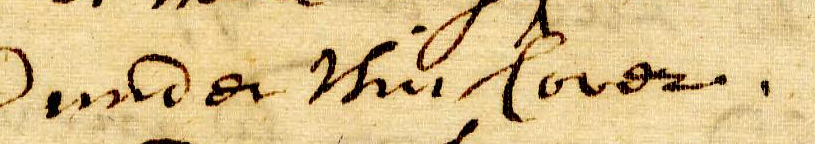under this Cover.
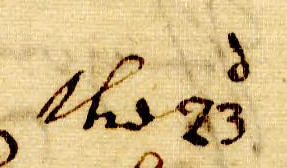the 23^d
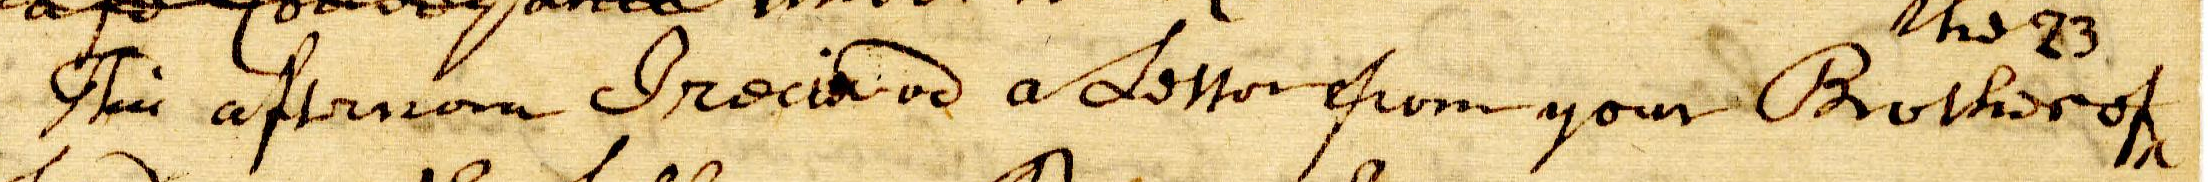This afternoon I recieved a Letter from your Brother of^
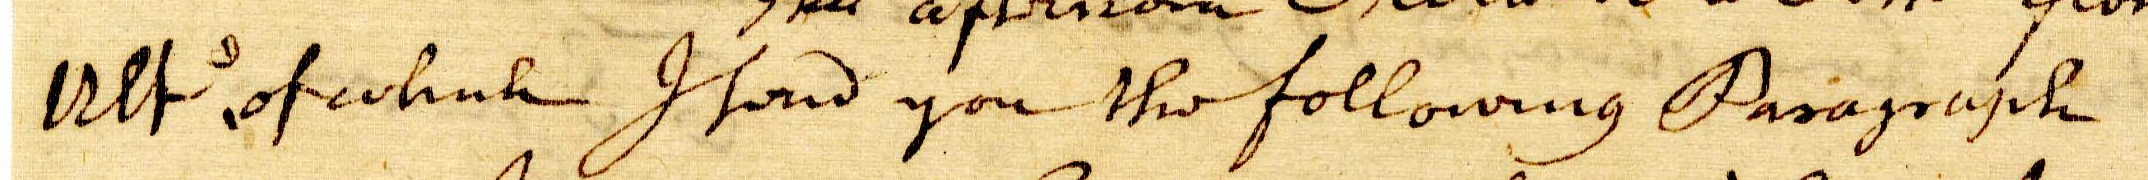Ult^e. of which I send you the following Paragraph
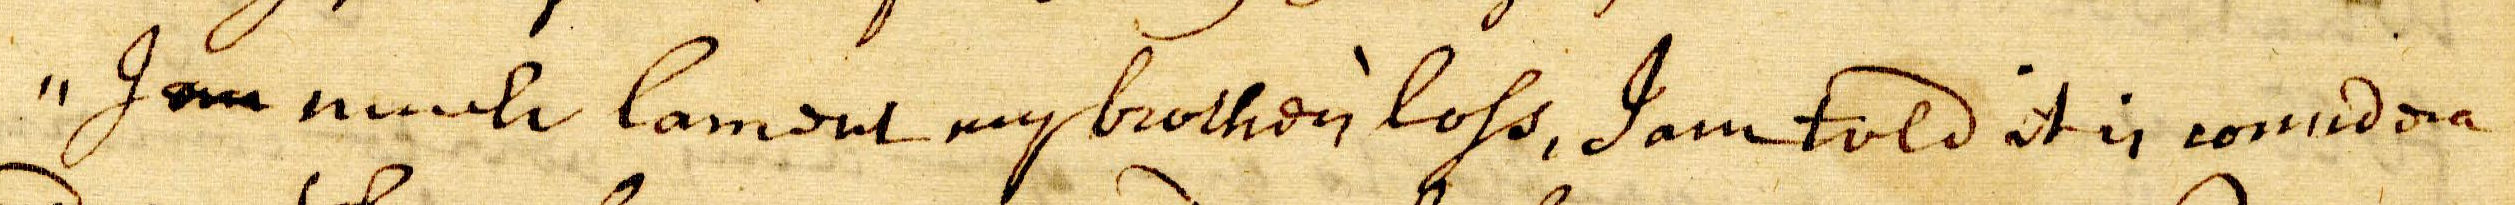"I [am] much lament my brother's loss, I am told it is considera
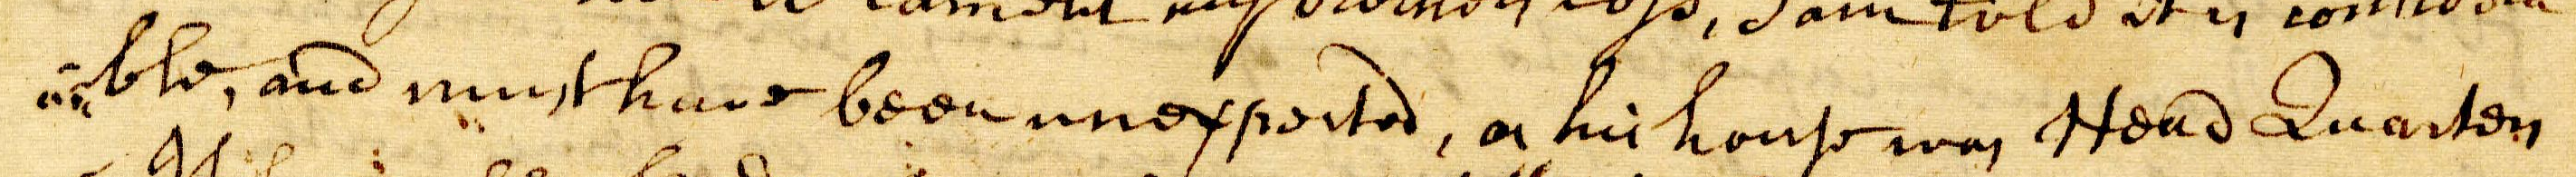=ble, and must have been unexpected, as his house was Head Quarters
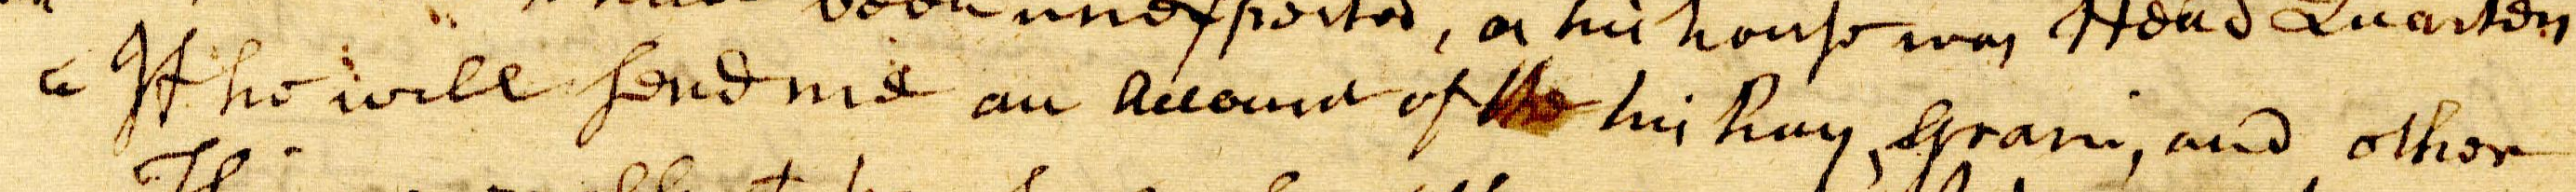If he will send me an Account of [the] his hay grain, and other
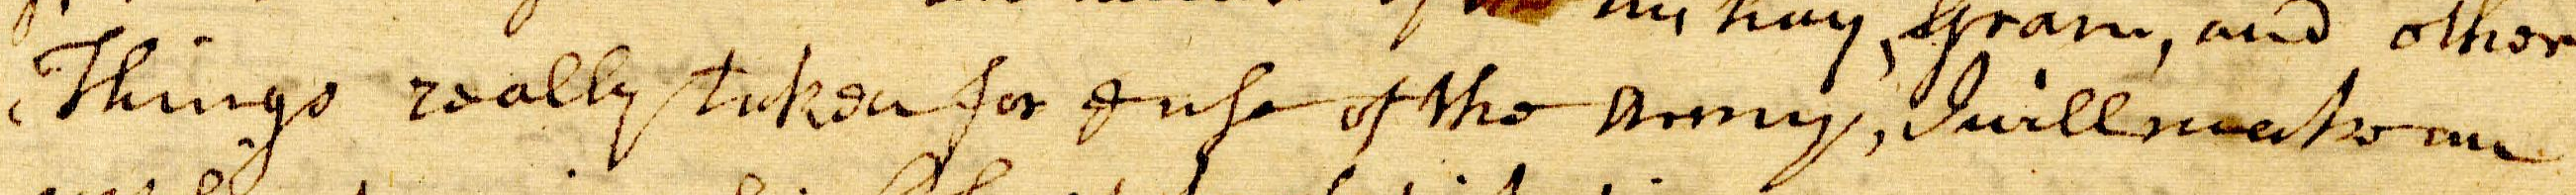Things really taken for y^e use of the Army, I will make an
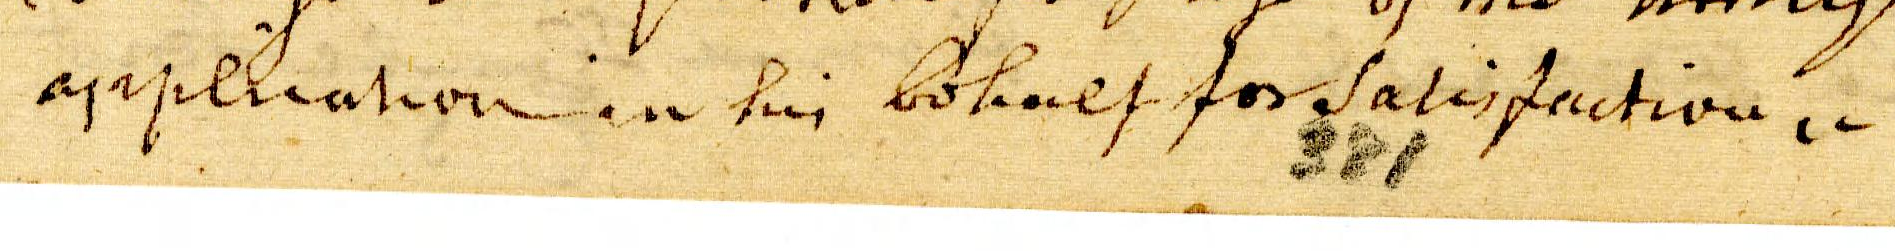application in his behalf for Satisfaction in
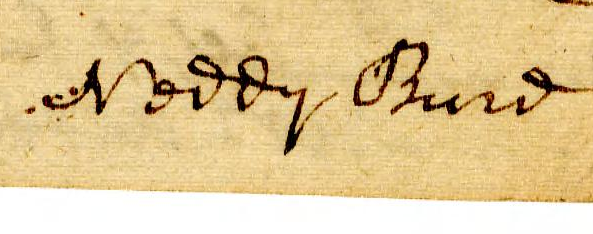Neddy Burd
